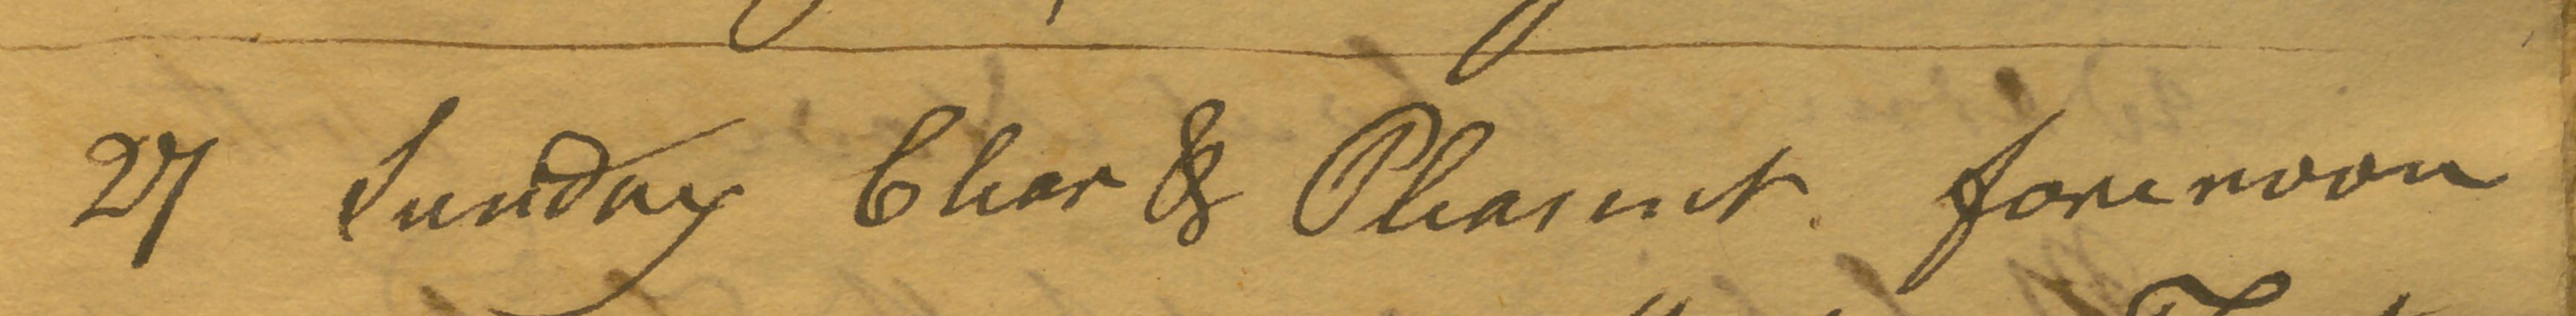27 Sunday Clear & Pleasent forenoon
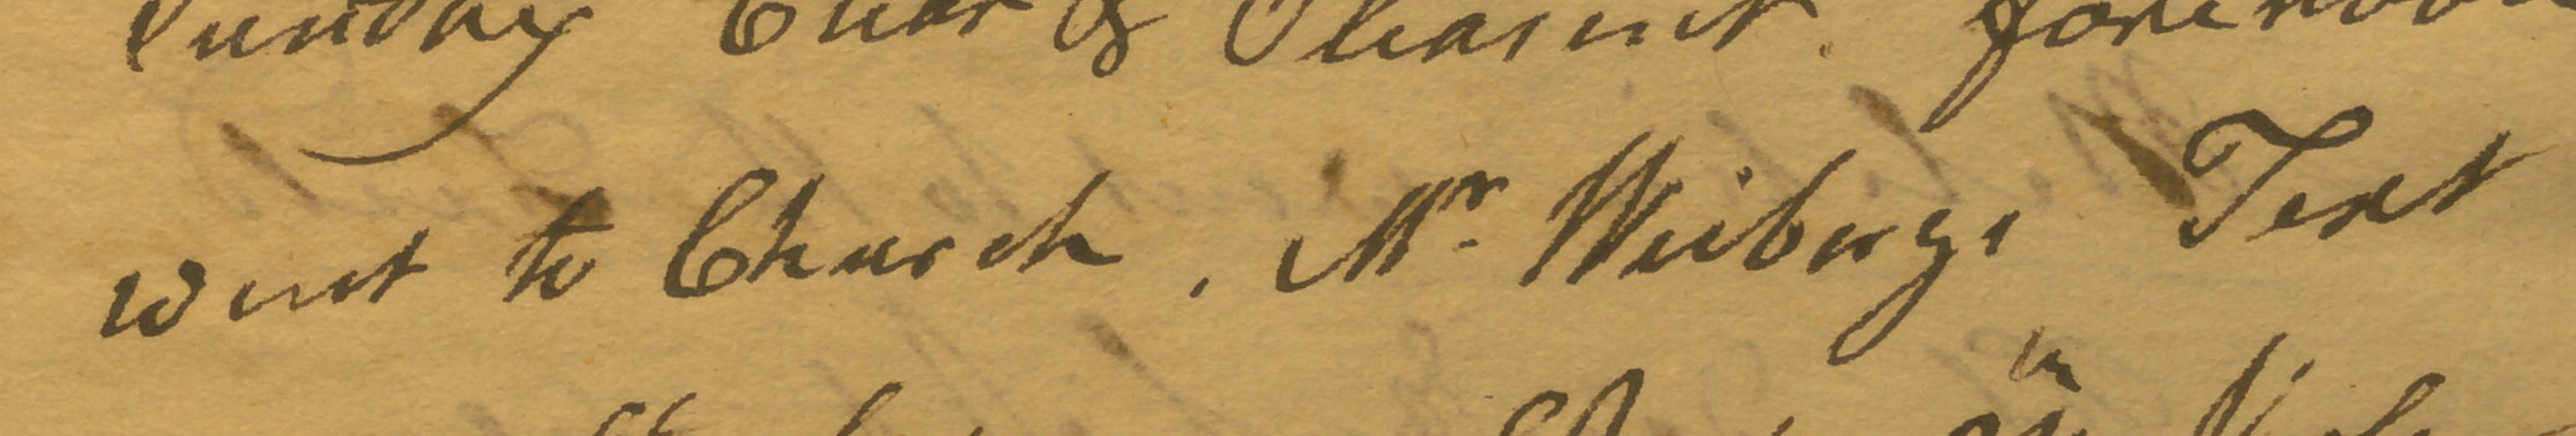went to Church, M^r. Weibergs Text
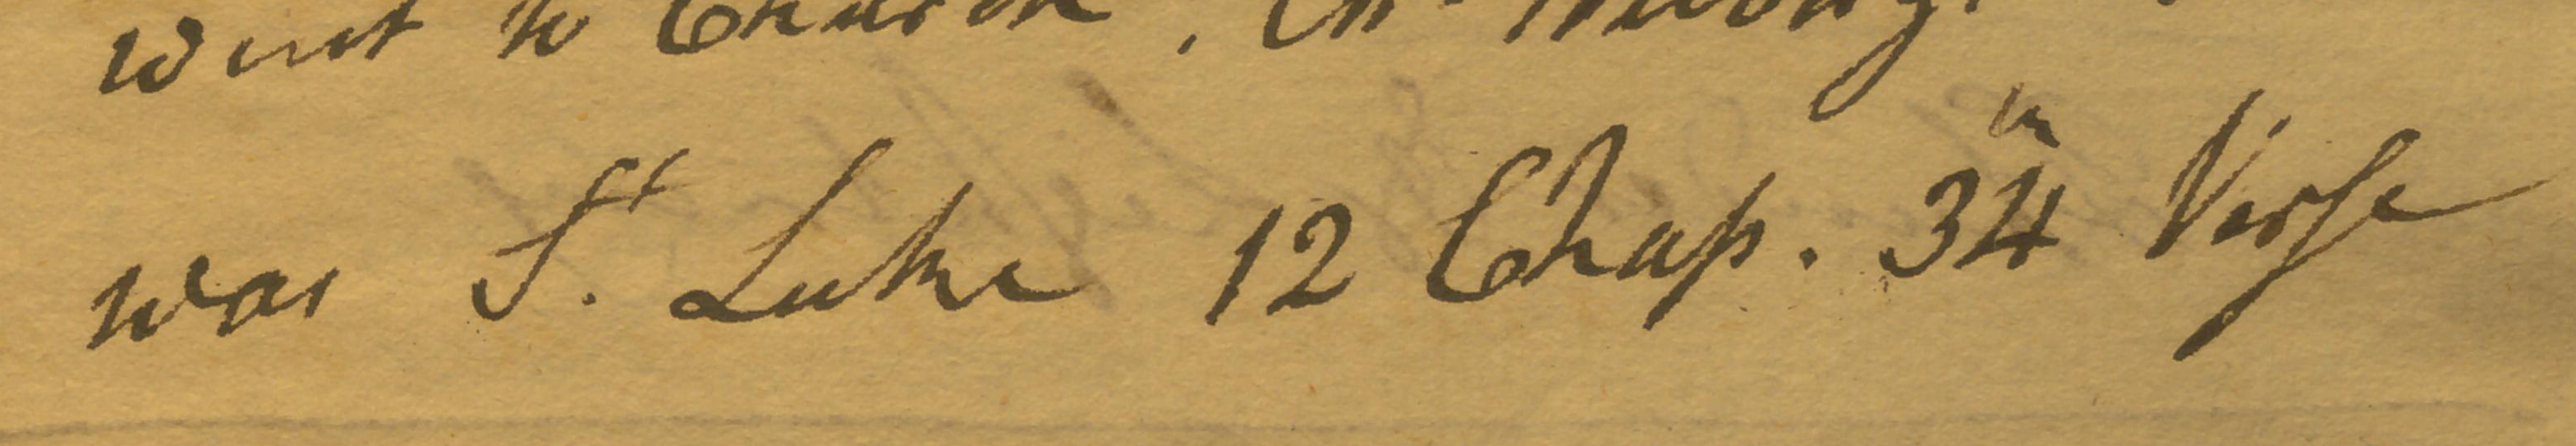was S^t. Luke 12 Chap. 34^th Verse
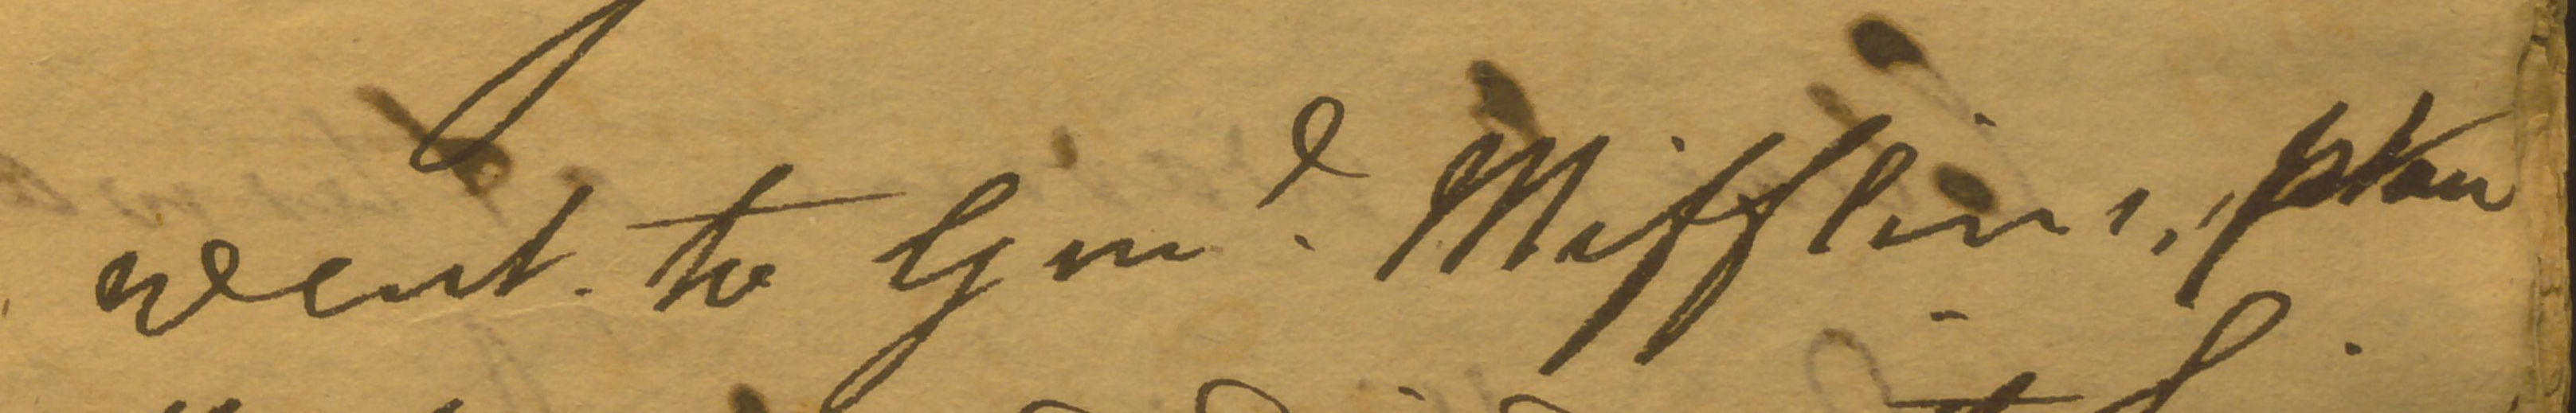went to Gen^l. Mifflins plan
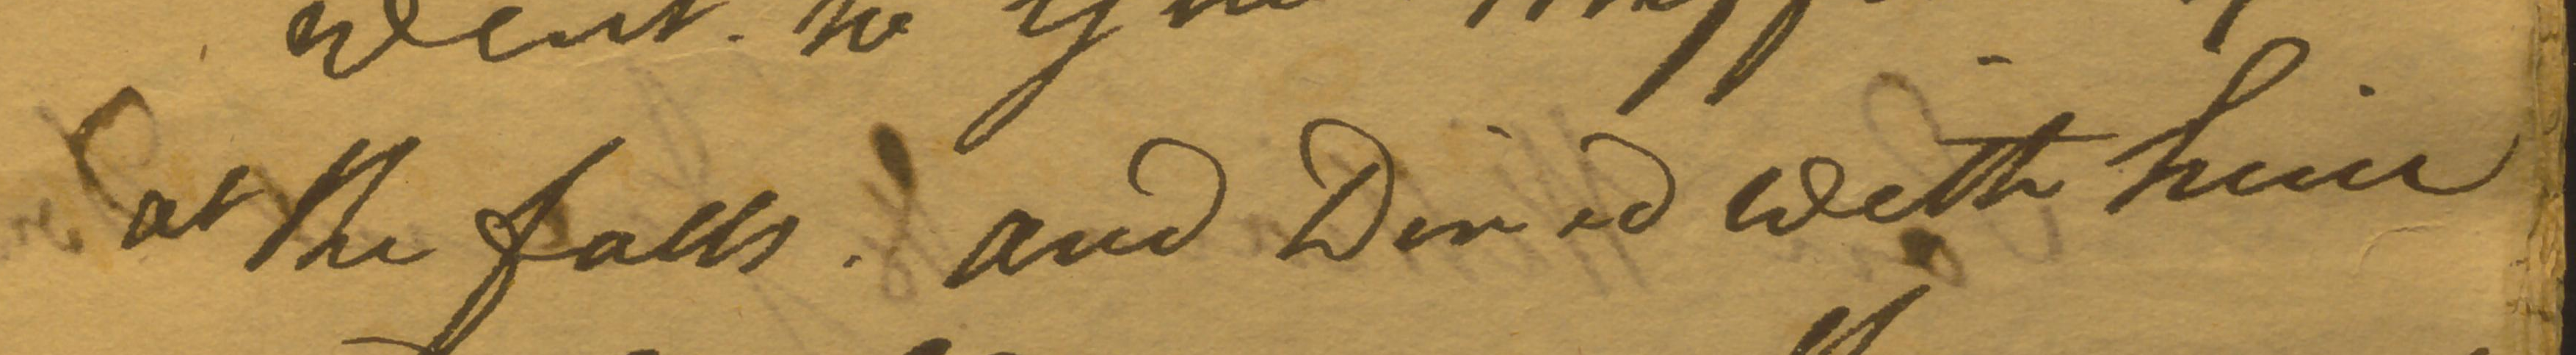at the falls and Dined with him
